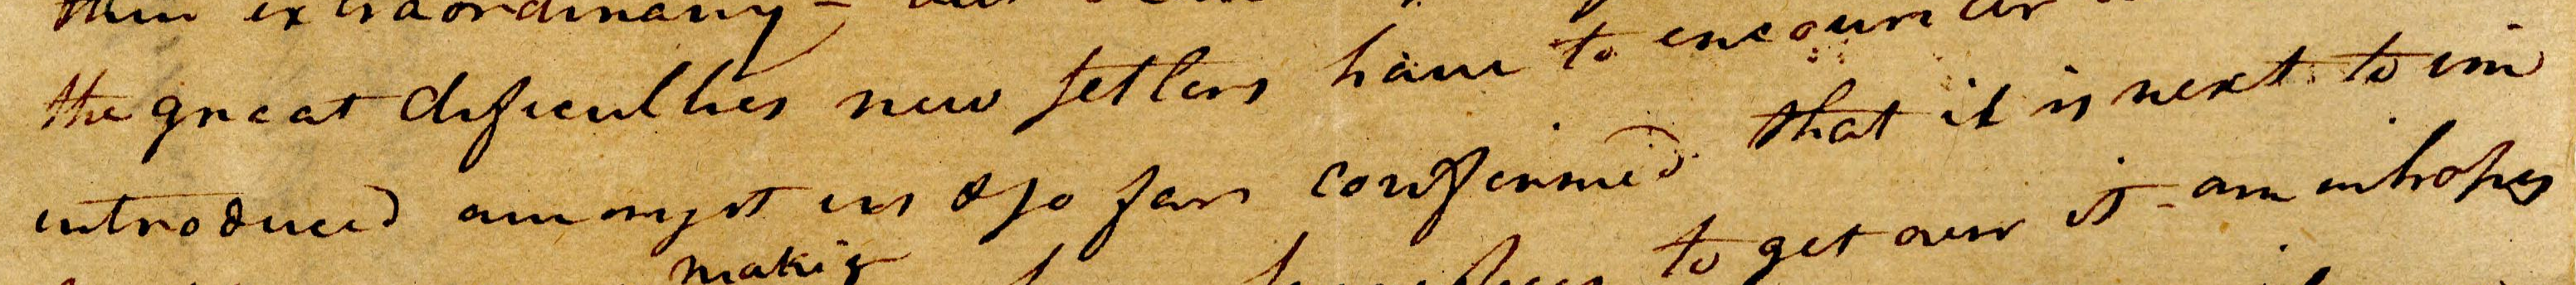introduced amongst us & so far confirmed that it is next to im
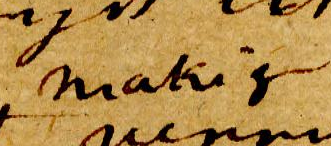making
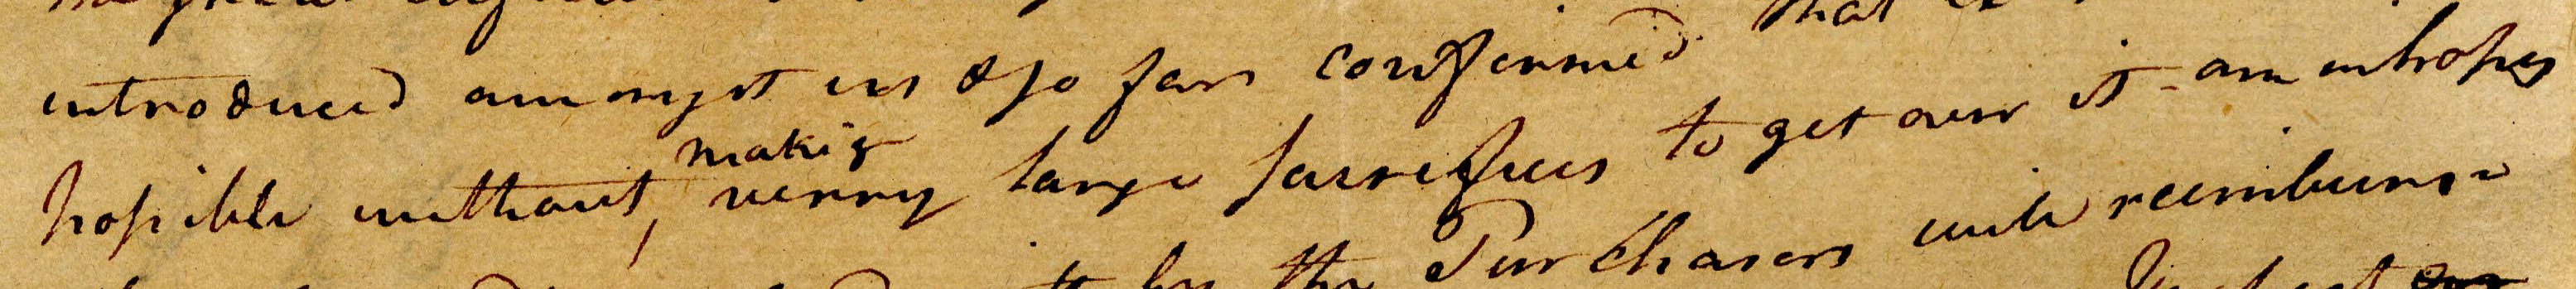possible without, ^ verry large sacrifices to get over it am in hopes
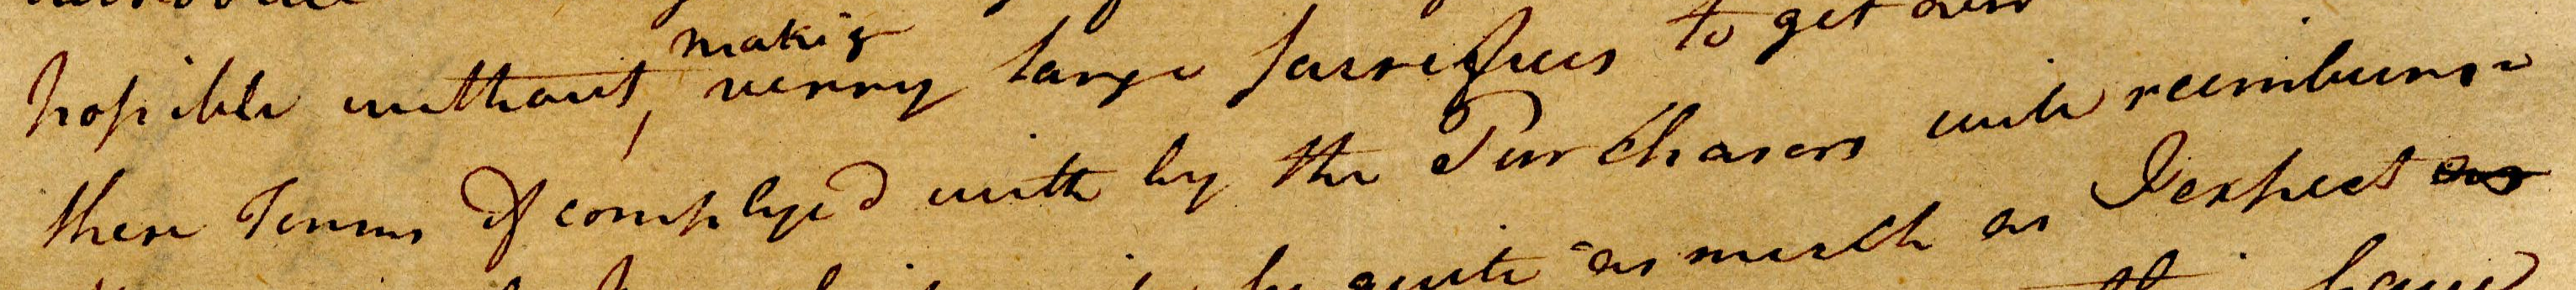these Terms if complyed with by the Purchasers will reimburse
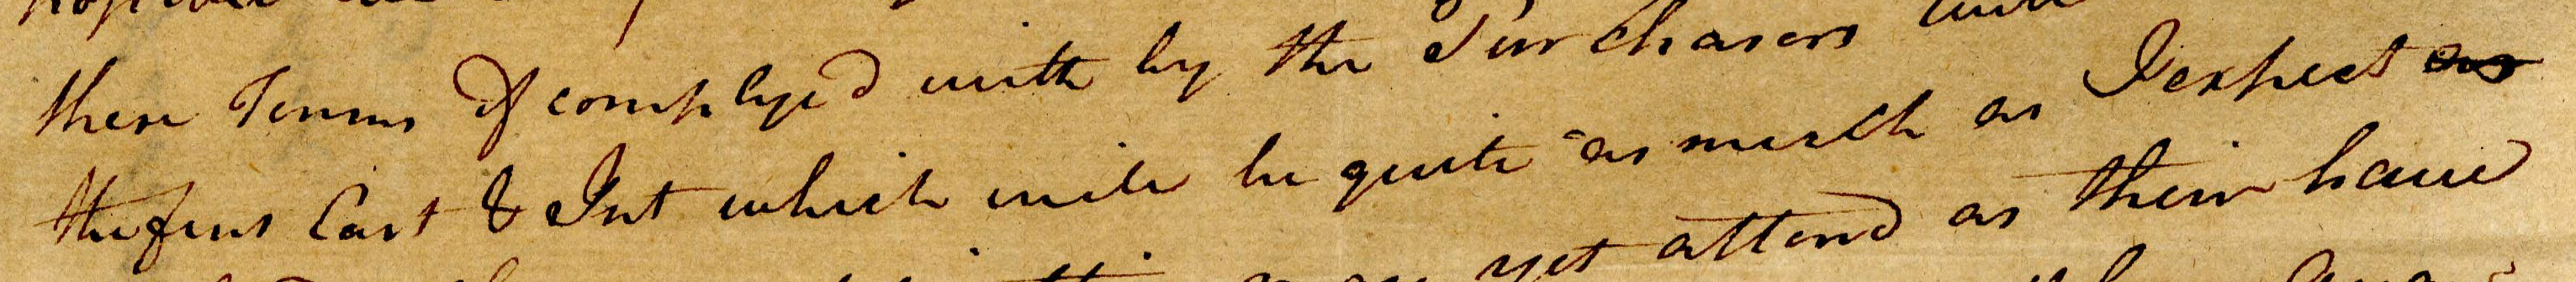the first Cart & Int which will be quite as much as I expect [as]
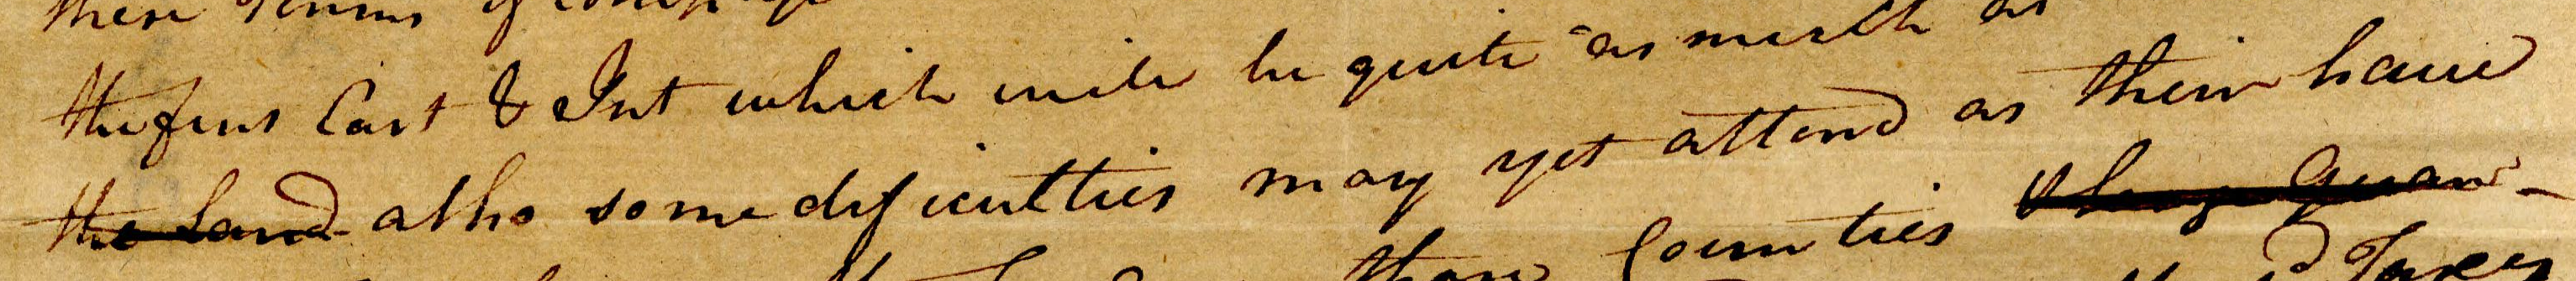[the Land] atho some difficulties may yet attend as their have
